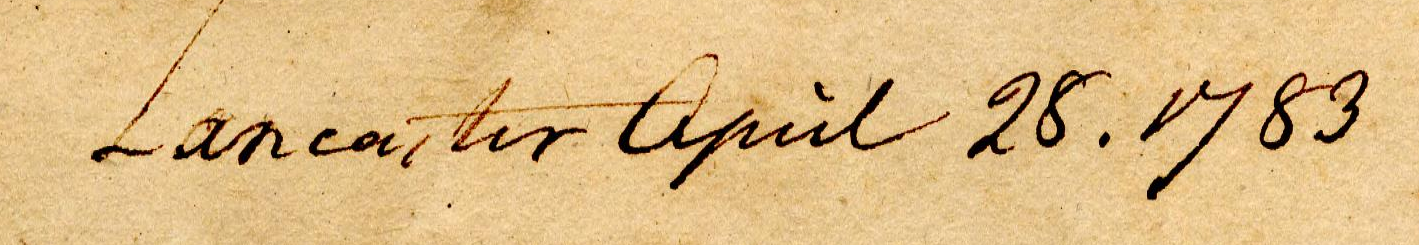Lancaster April 28. 1783
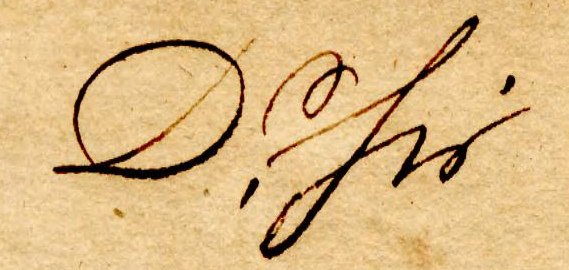D^r. Sir
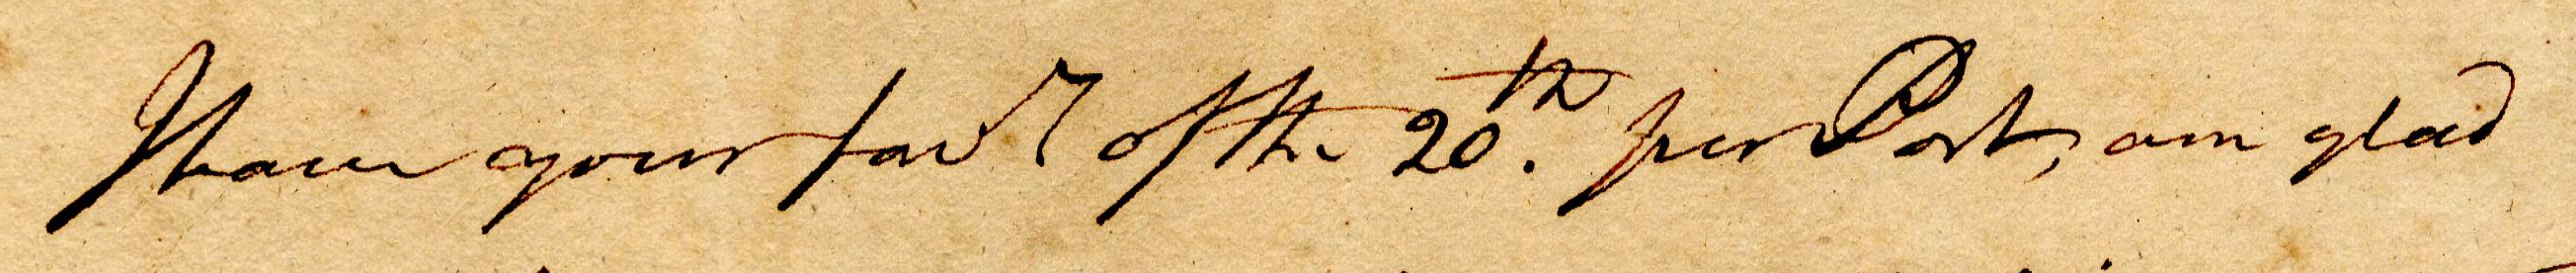I have your fav^r. of the 20^th. per Post, am glad
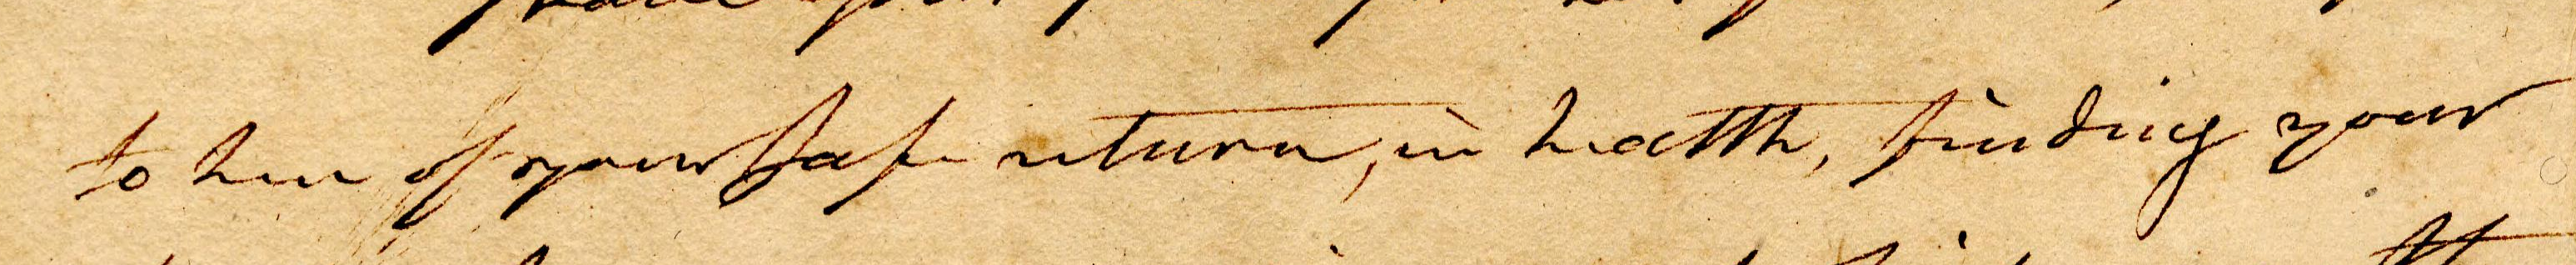to here of your safe return, in health, finding your
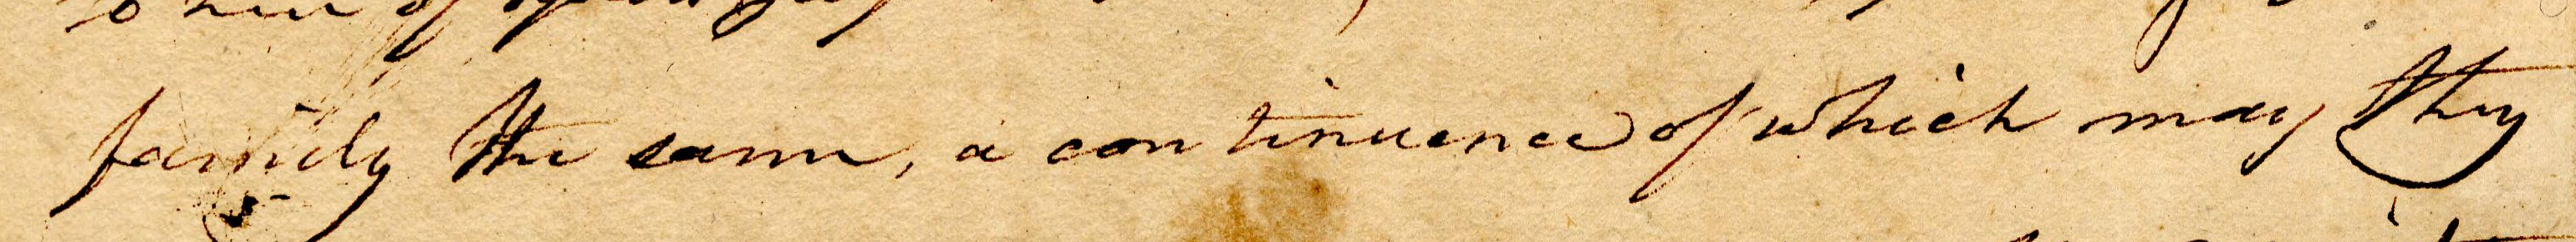family the same, a continuance of which may thy
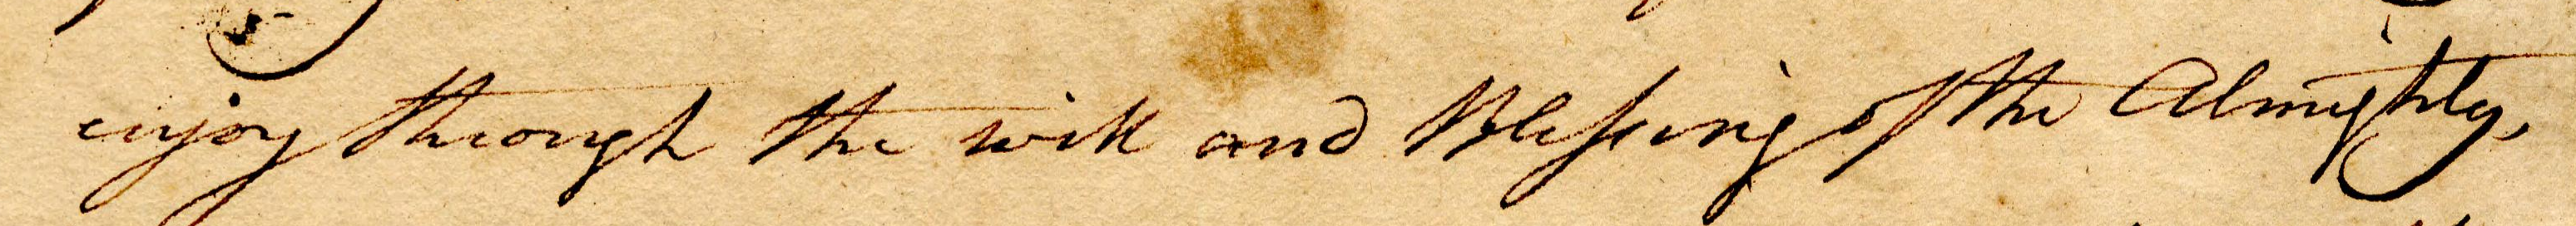enjoy through the will and blessing of the Almighty
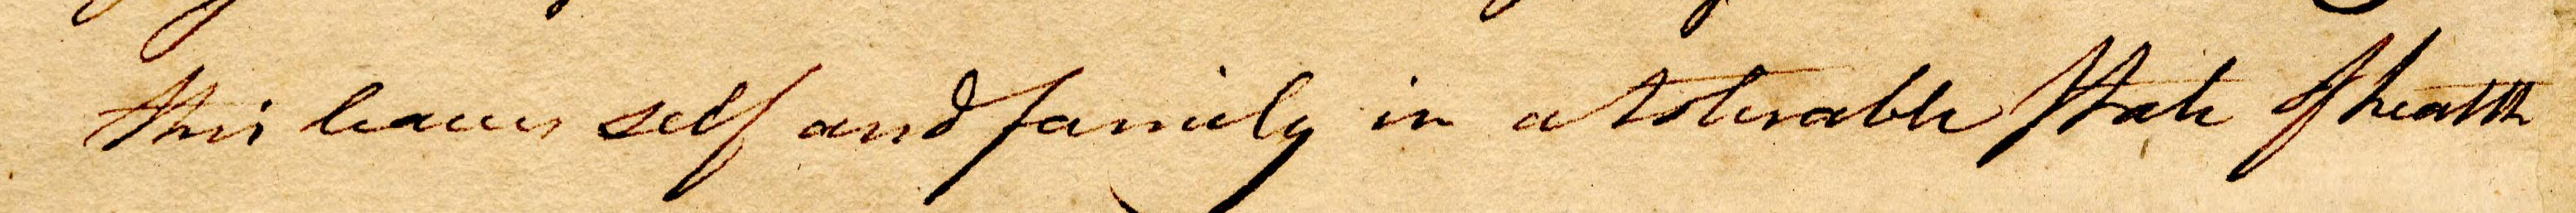this leaves self and family in a tolerable state of heath
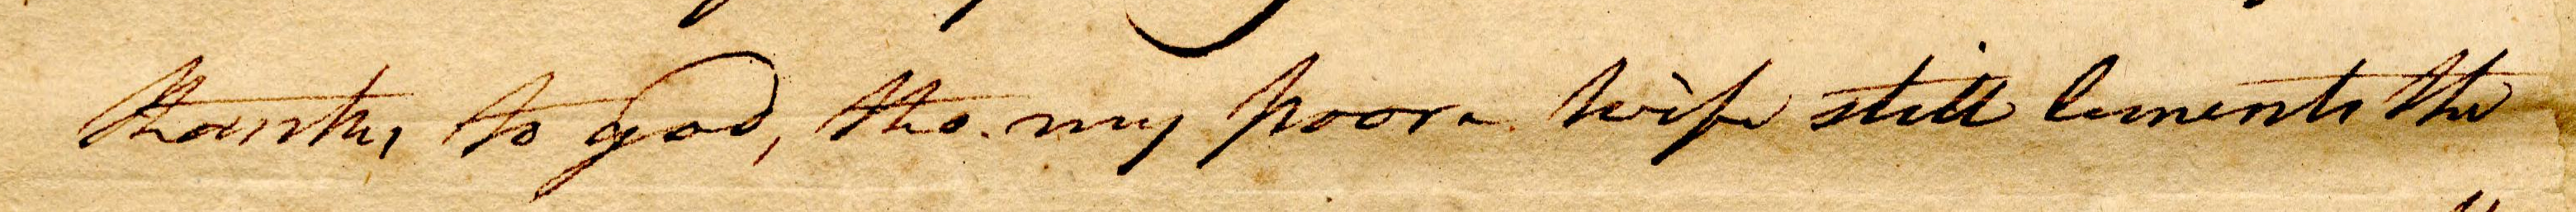thanks to God, tho my poore wife still laments the
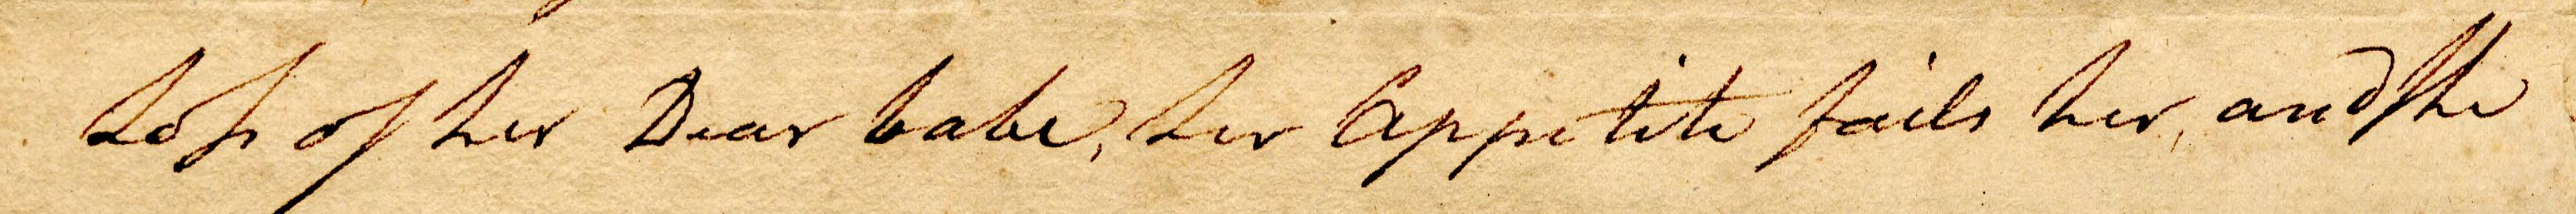Loss of her Dear babe, her Appetite fails her, and she
